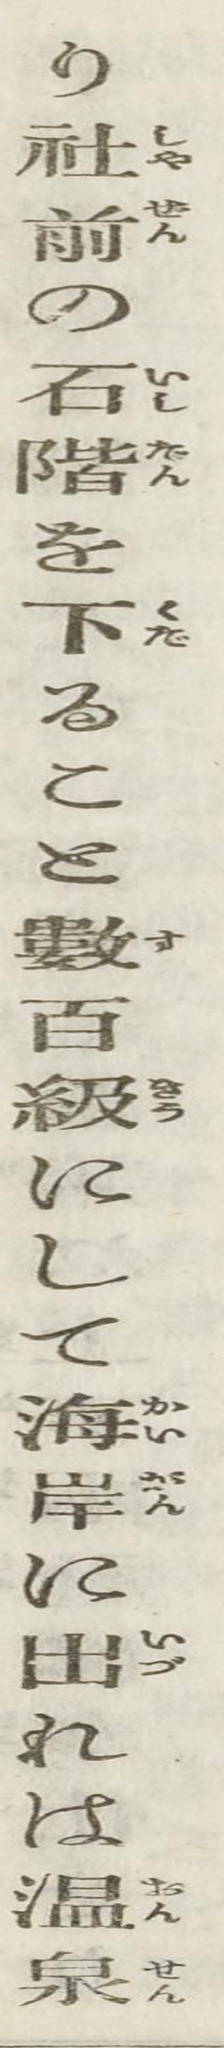り社前の石階を下ること数百級にして海岸に出れば温泉
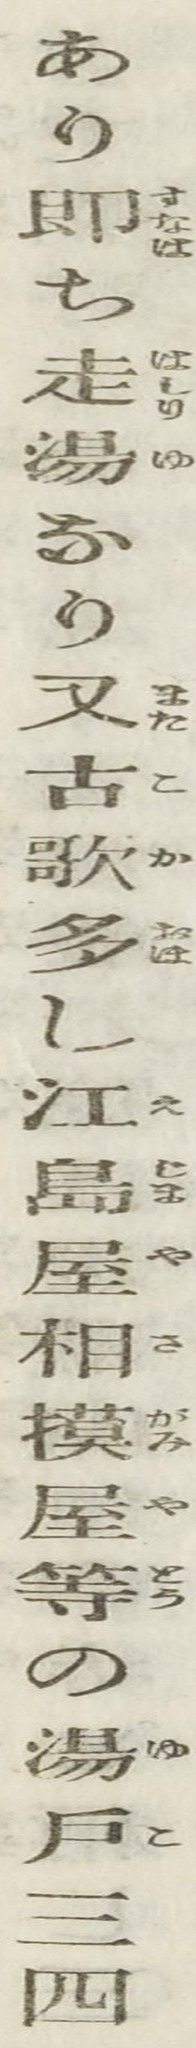あり即ち走湯なり又古歌多し江島屋相模屋等の湯戸三四
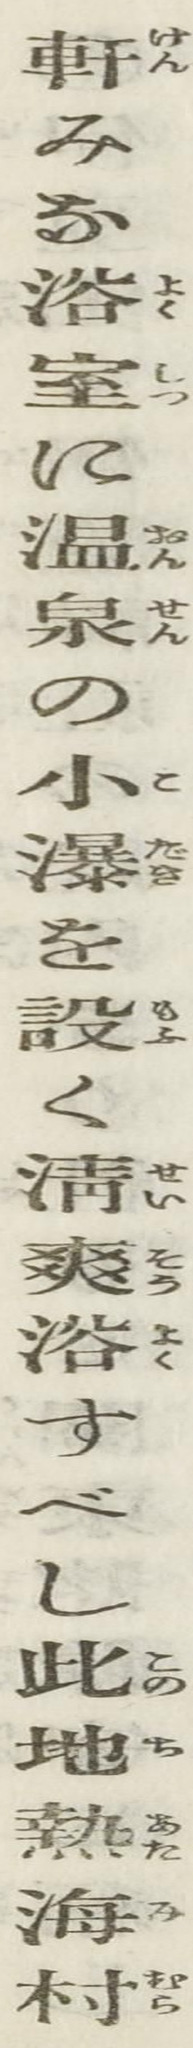軒みな浴室に温泉の小瀑を設く清爽浴すべし此地熱海村
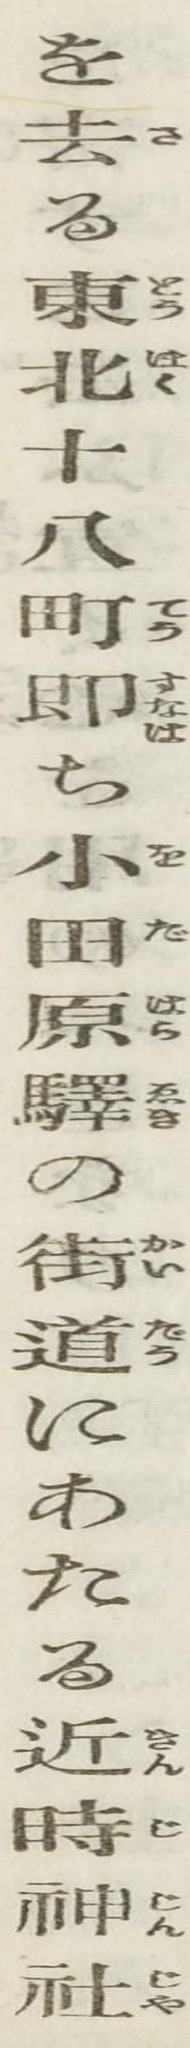を去る東北十八町即ち小田原驛の街道にあたる近時神社
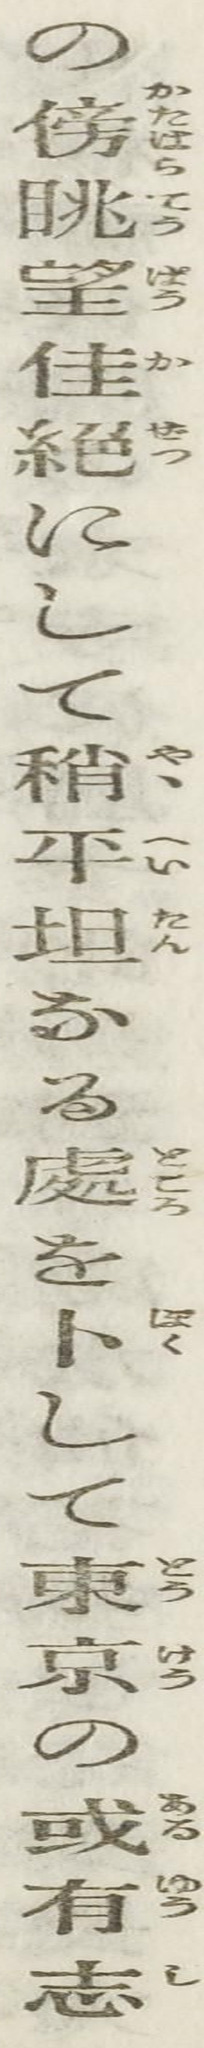の傍眺望佳絶にして稍平坦なる處を卜して東京の或有志
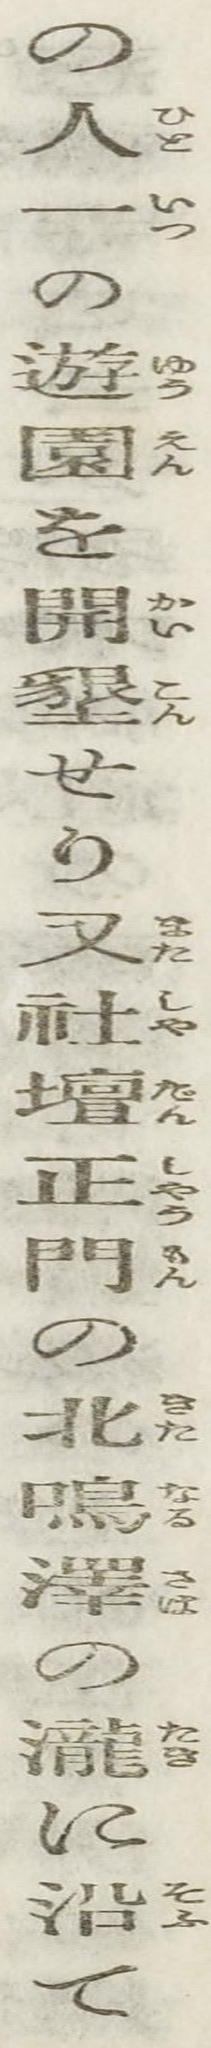の人一の遊園を開墾せり又社壇正面の北鳴澤の瀧に沿て
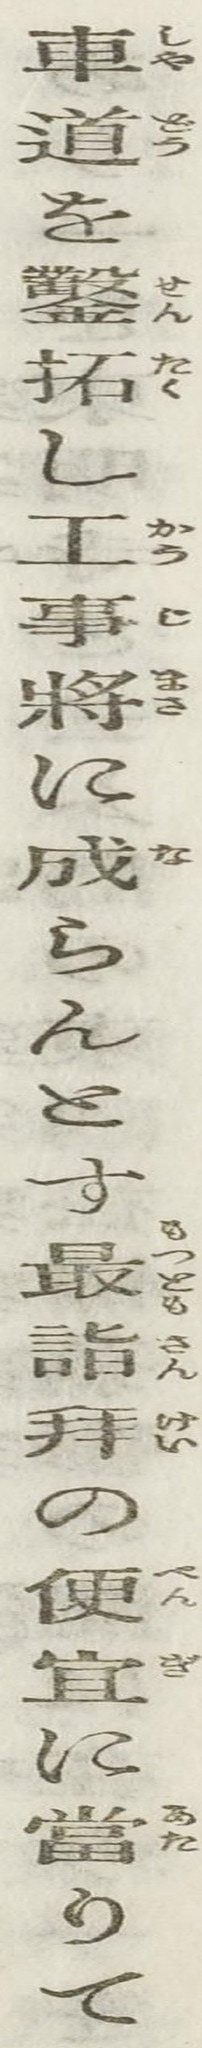車道を鑿拓し工事将に成らんとす最詣拝の便宜に當りて
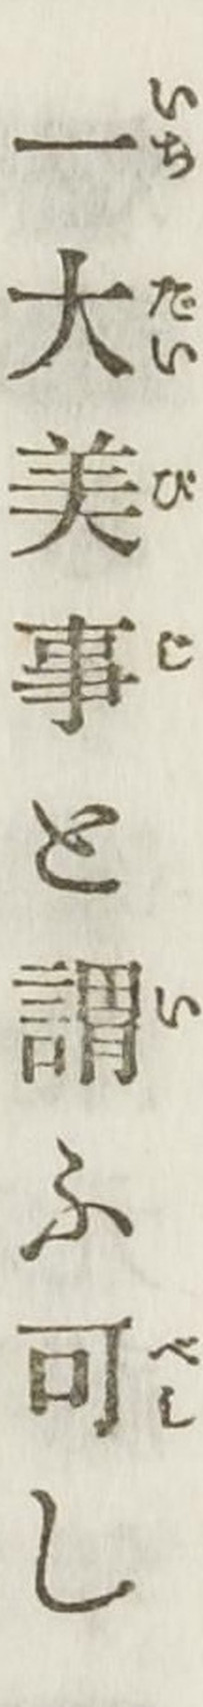一大美事と謂ふ可し
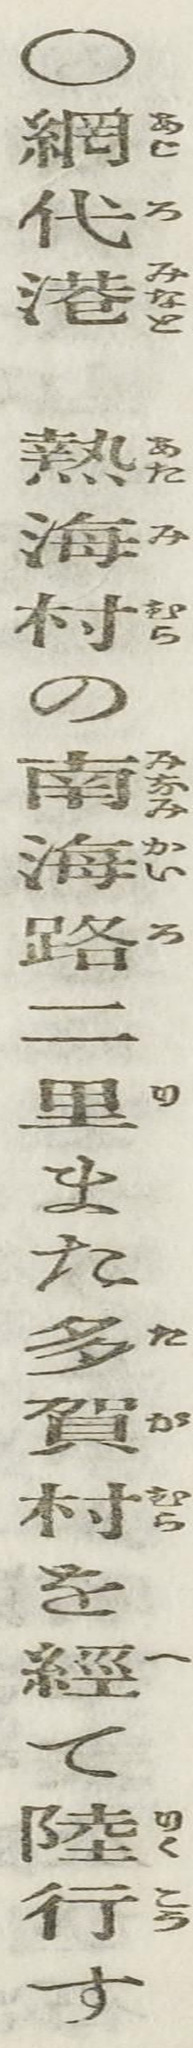○網代港熱海村の南海路二里また多賀村を経て陸行す
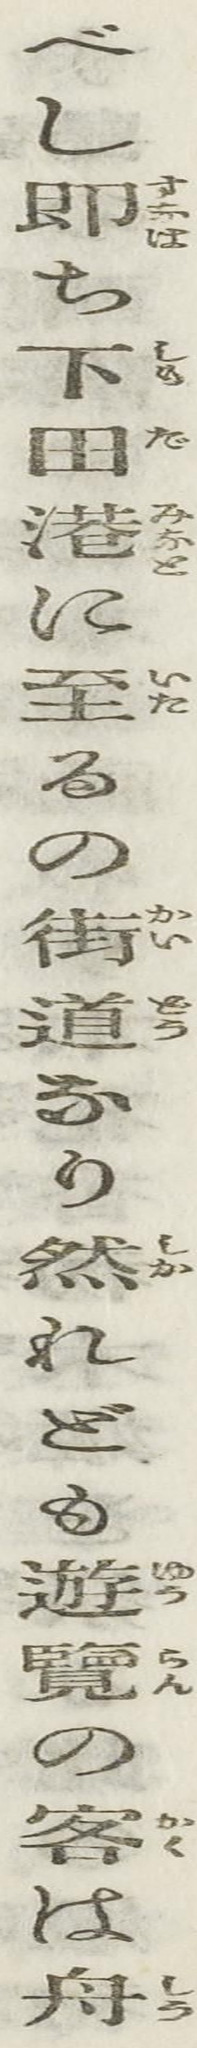べし即ち下田港に至るの街道なり然れども遊覧の客は舟
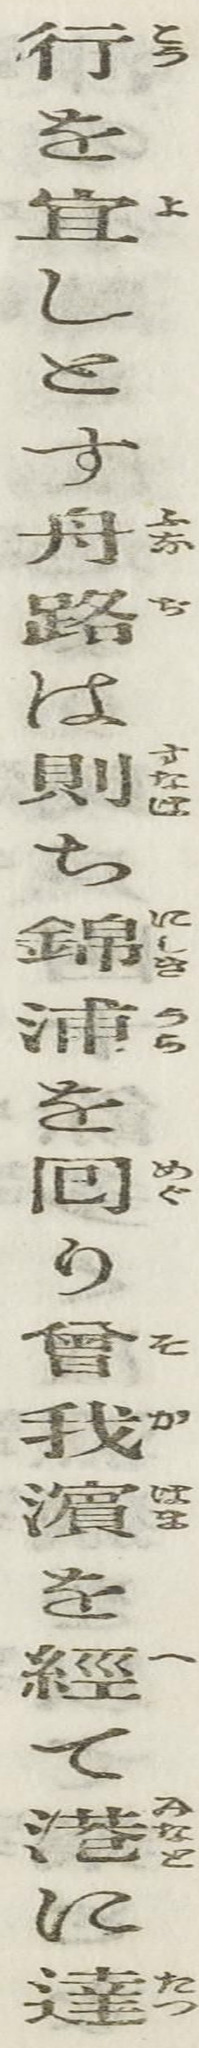行を宜しとす舟路は則ち錦浦を囘り曽我浜を経て港に達
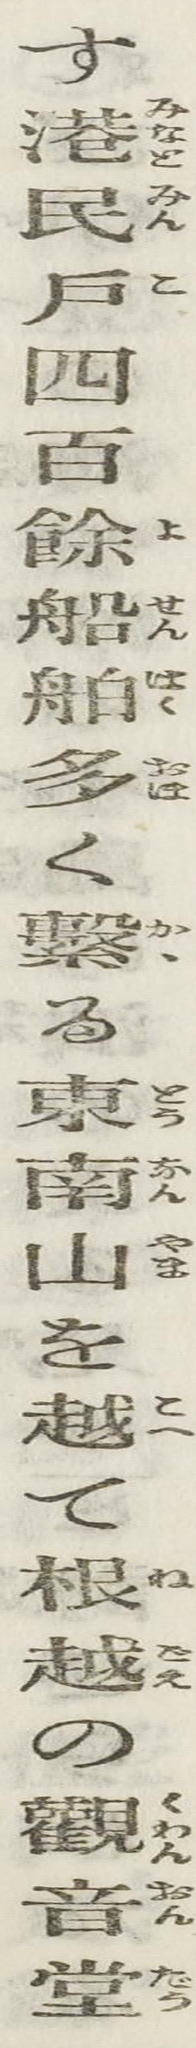す港民戸四百餘船舶多く繋る東南山を越て根越の観音堂
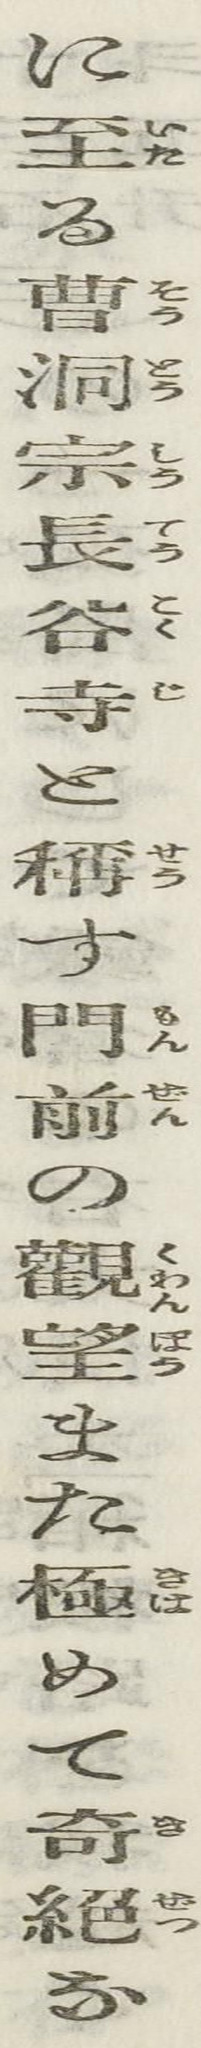に至る曹洞宗長谷寺と称す門前の観望また極めて奇絶な
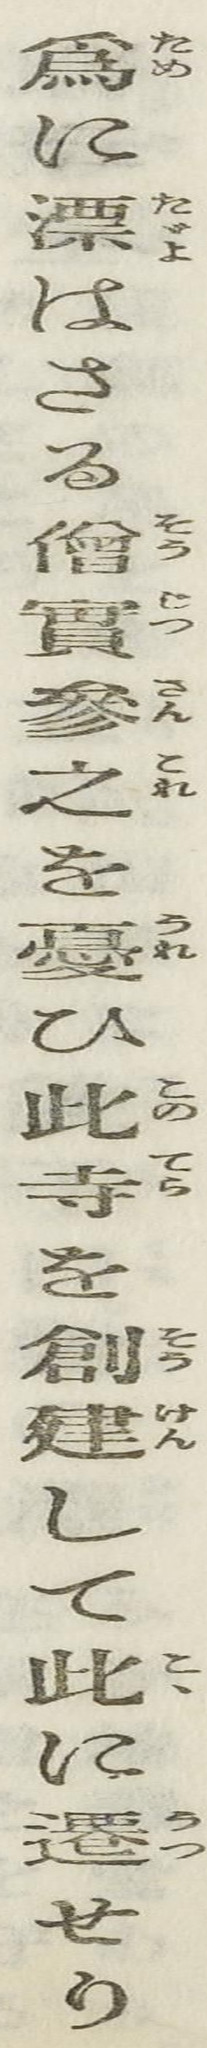為に漂はさる僧実参之を憂ひ此寺を創建して此に遷せり

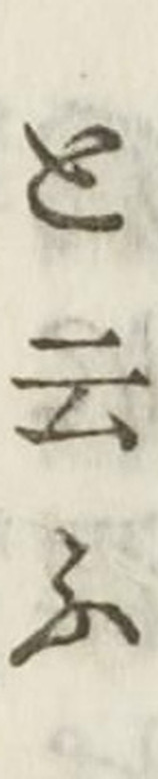と云ふ
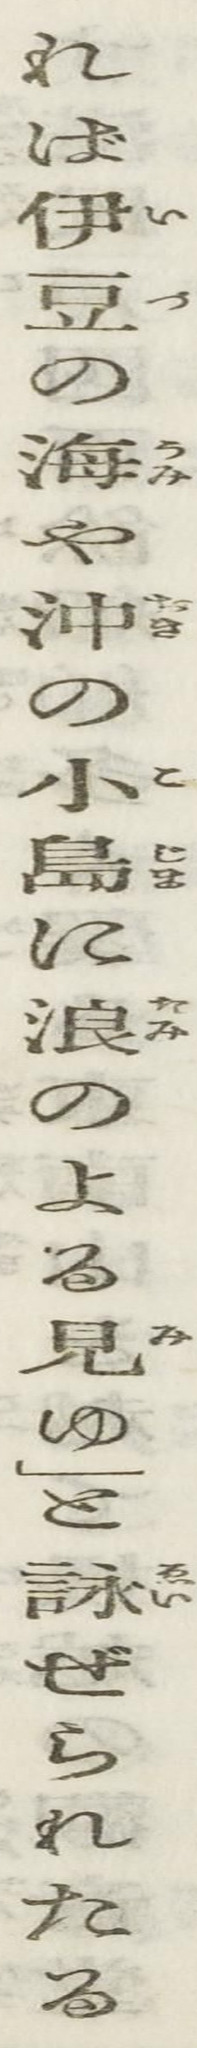れば伊豆の海や沖の小島に浪のよる見ゆ」と詠ぜられたる
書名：熱海獨案内　全
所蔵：東京大学地震研究所図書室 Earthquake Research Institute Library, The University of Tokyo, JAPAN
